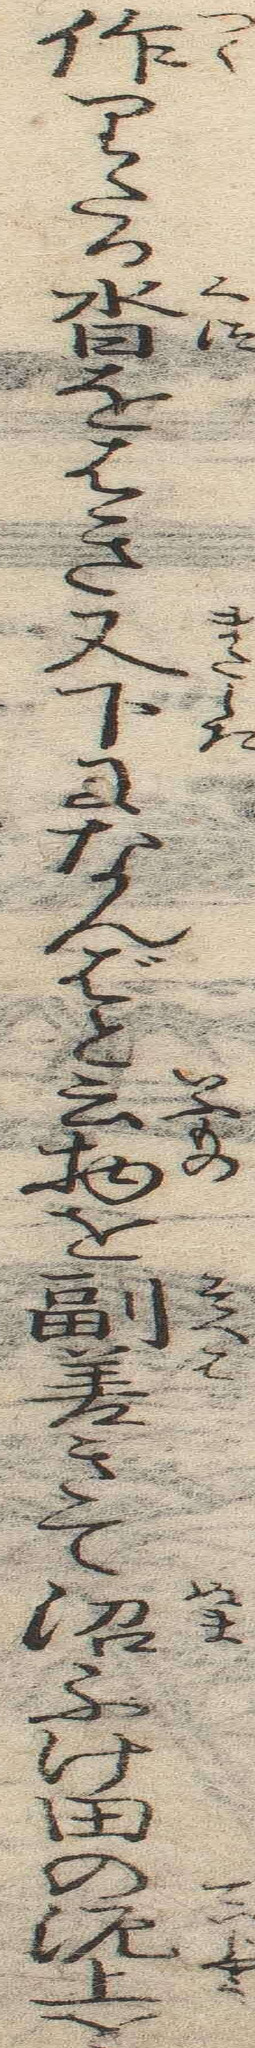作りたる沓をはき又下になんばと云物を副差きて沼ふけ田の泥上を
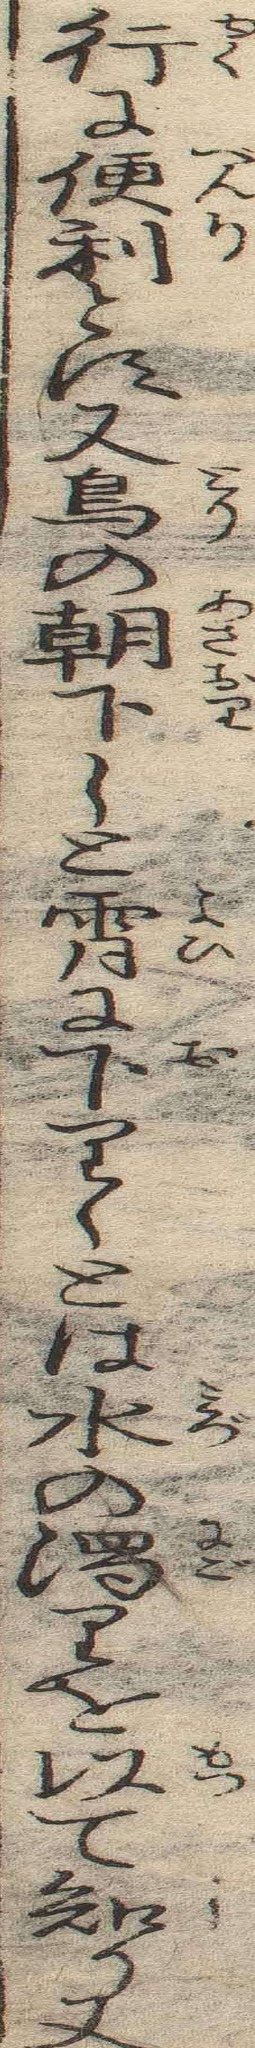行に便利とす又鳥の朝下しと宵に下りしとは水の濁りを以て知り又

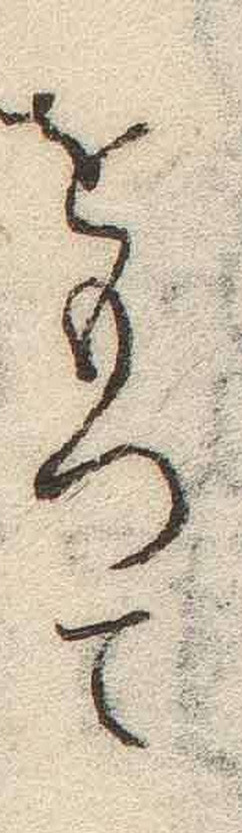をもつて
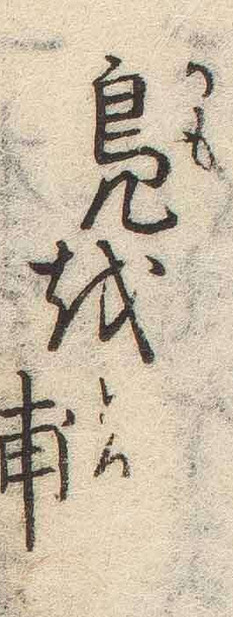鳧を捕
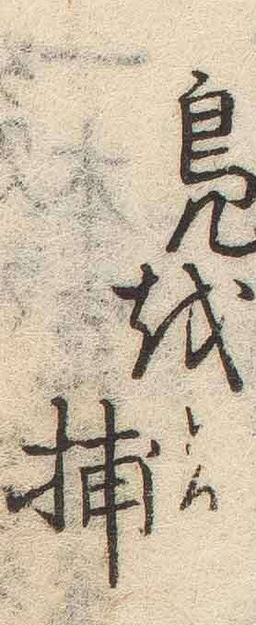鳧を捕

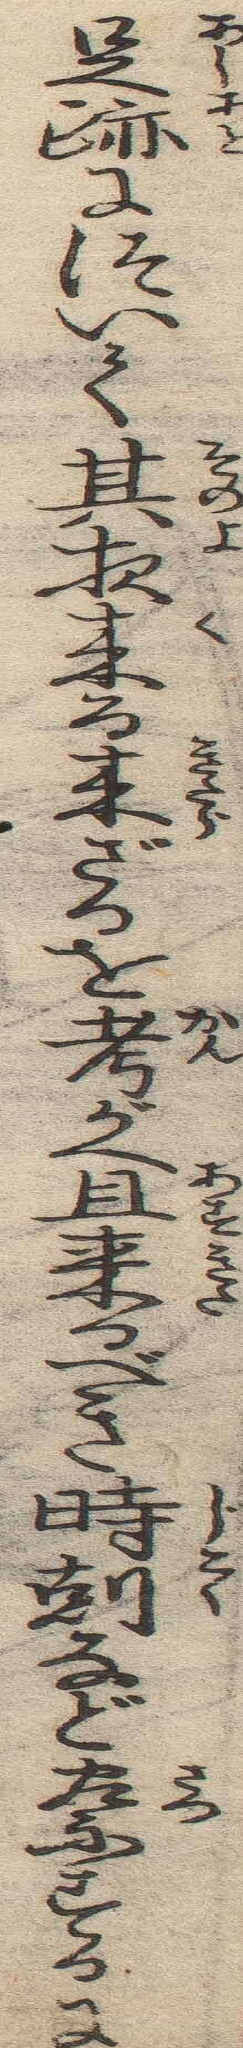足跡について其夜来る来ざるを考がへ旦来るべき時刻など察するに
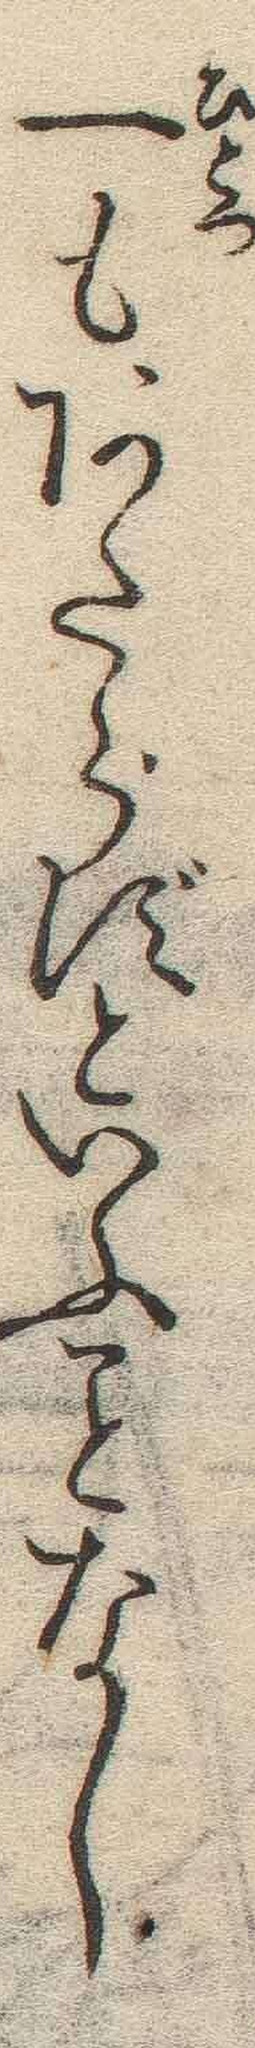一もあたらずといふことなし
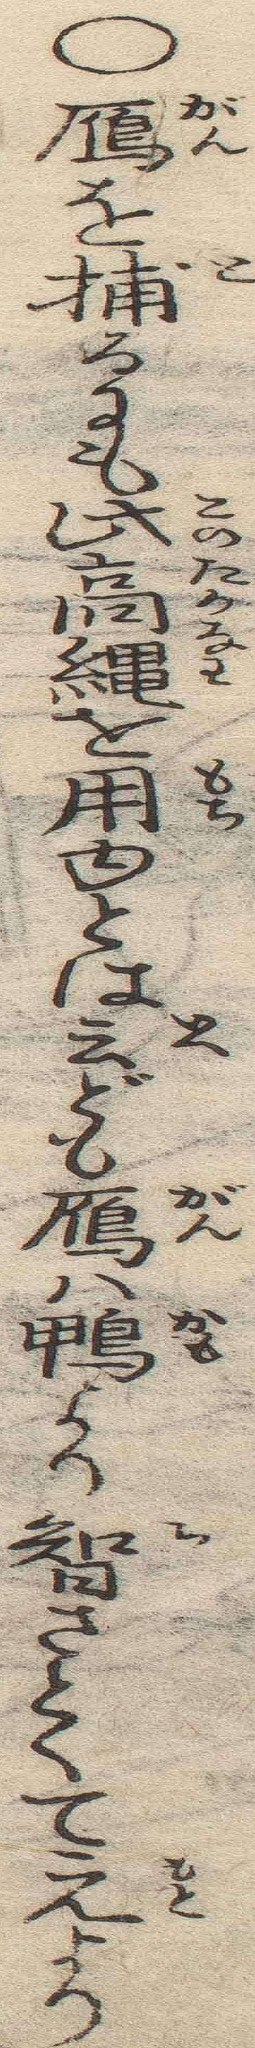○雁を捕るにも此高縄を用ゆとは云ども雁は鴨より智さとくて元より
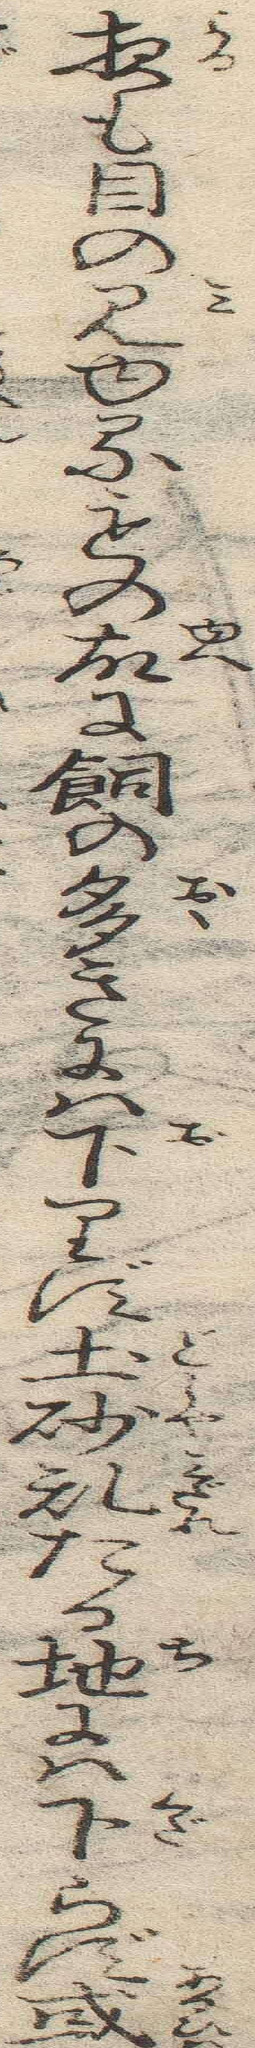夜も目の見ゆるもの故に飼の多きには下りず土砂乱たる地には下らず或
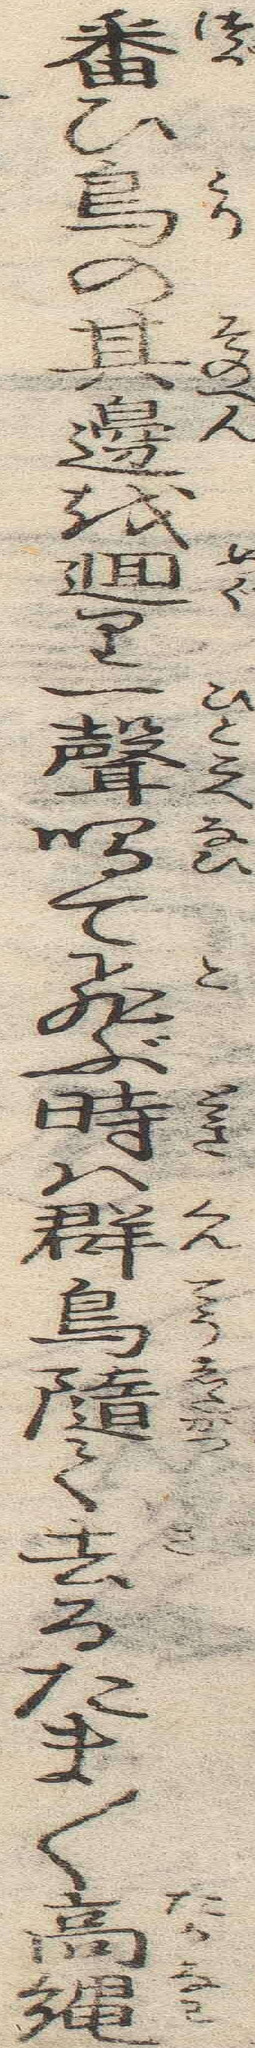番ひ鳥の其辺を廻り一声鳴て飛ぶ時は群鳥随て去るたま〳〵高縄
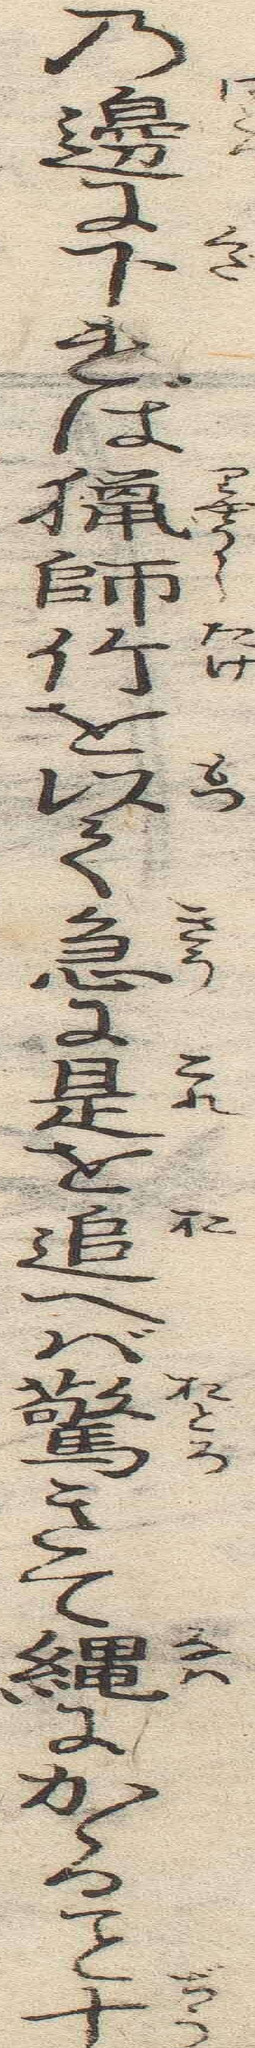の辺に下れば猟師竹を以て急に是を追へば驚きて縄にかゝること十
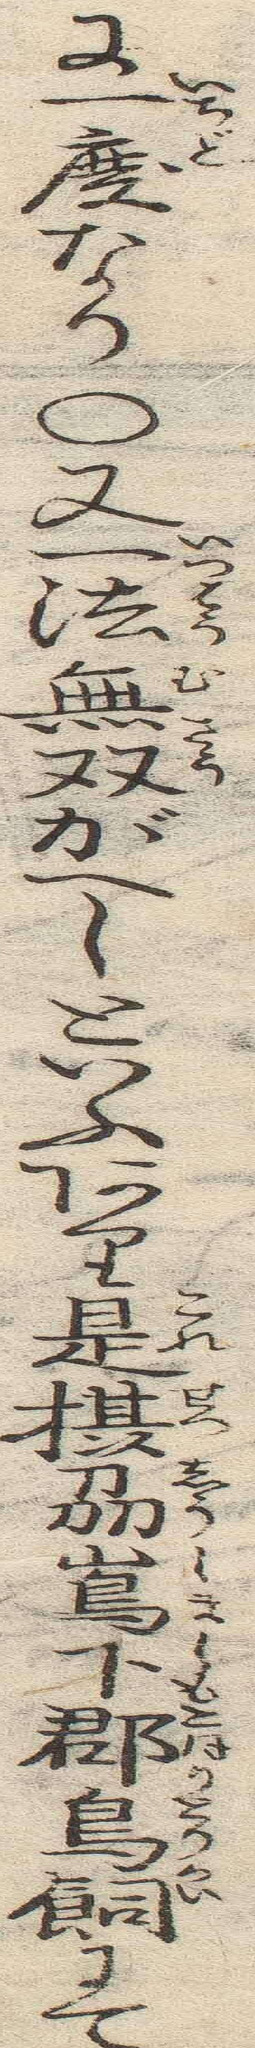に一度なり○又一法無双がへしといふあり是摂州島下郡鳥飼にて
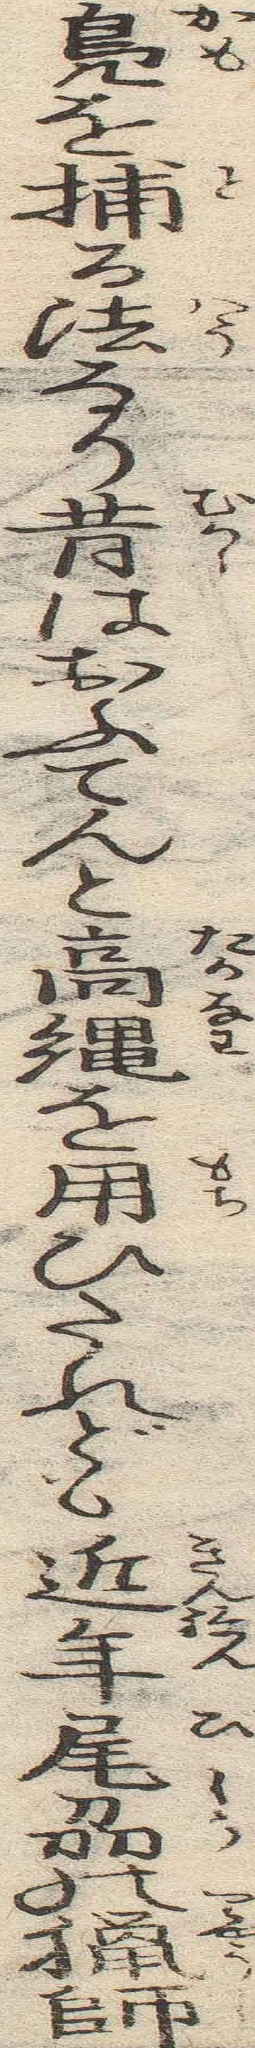鳧を捕る法なり昔はおふてんと高縄を用ひたれども近年尾州の猟師
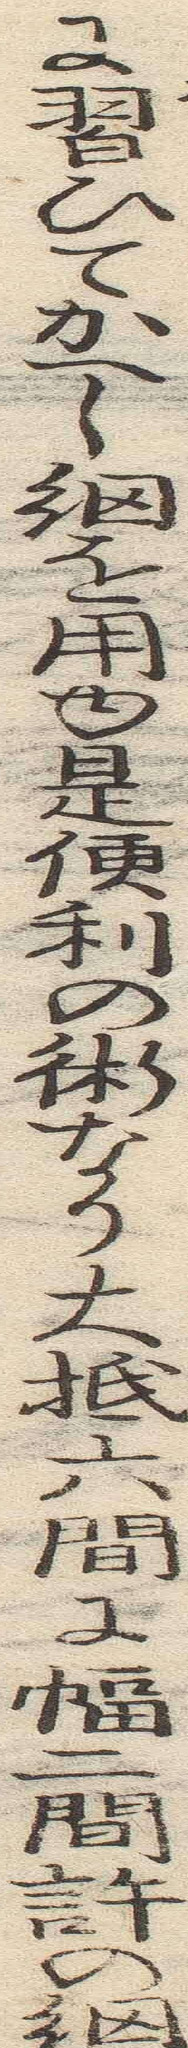に習ひてかへし網を用ゆ是便利の術なり大抵六間に幅二間許の網
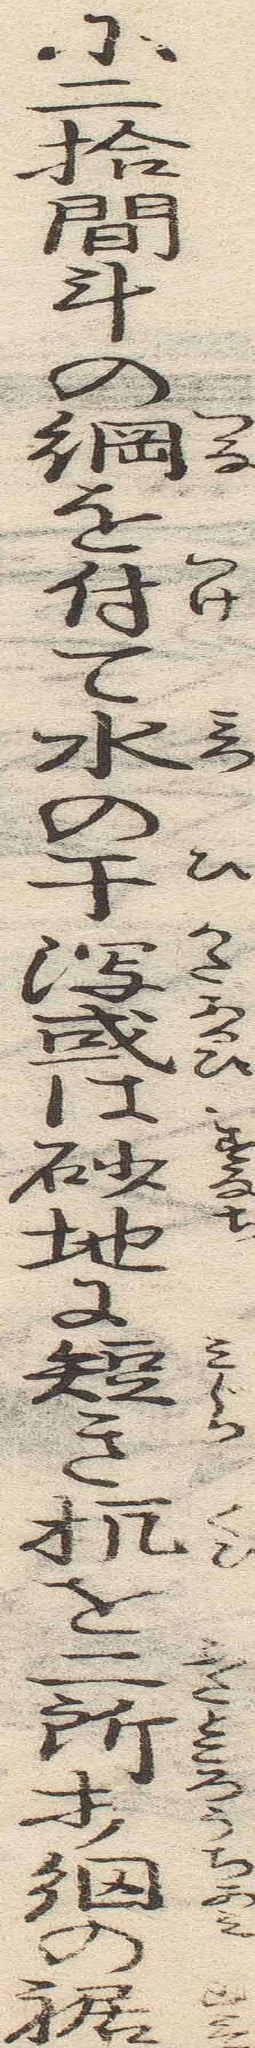に二拾間斗の綱を付て水の干潟或は砂地に短き杭を二所打網の裾
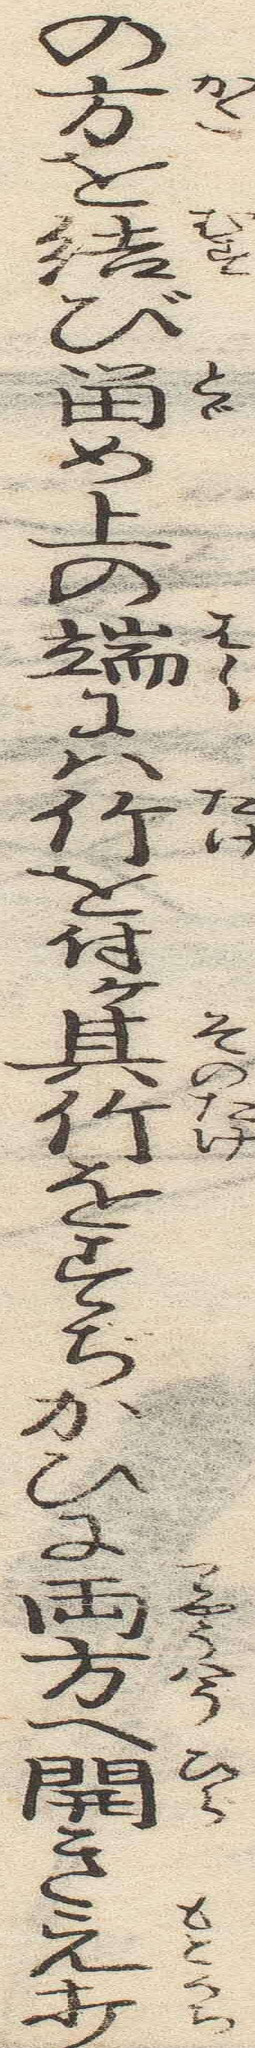の方を結び留め上の端には竹を付け其竹をすぢかひに両方へ開き元打
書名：日本山海名産図会
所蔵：東京学芸大学附属図書館 国文学研究資料館
